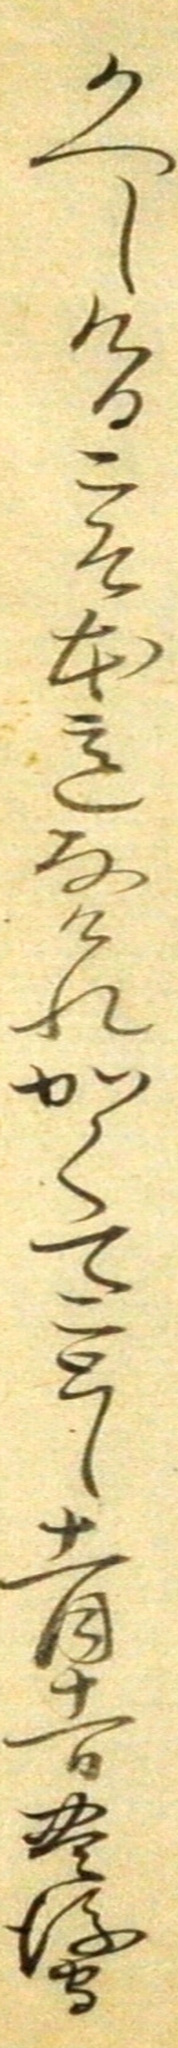かへしけるこそ本意なけれかくてことし十一月十一日豊後守
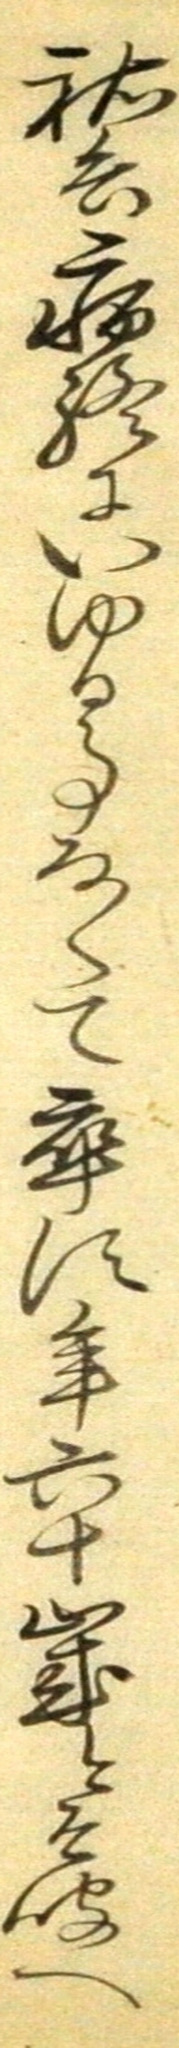祐兵病終にいゆる事なくて卒す年六十歳とそ聞へ
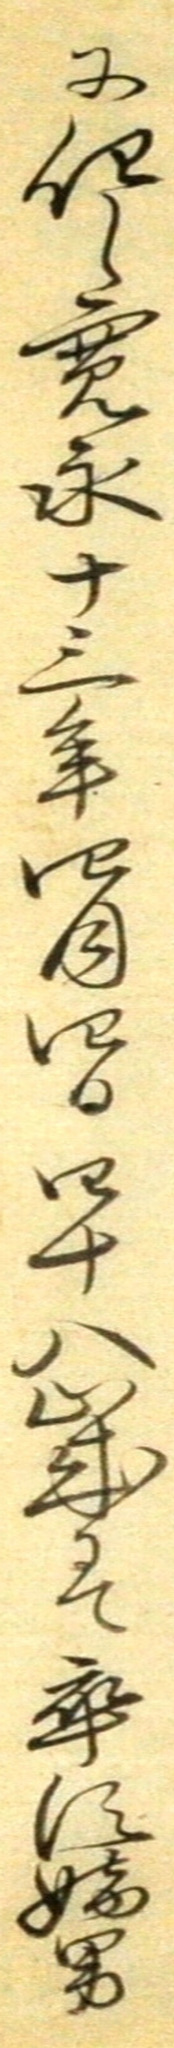に任し寛永十三年四月四日四十八歳にて卒す嫡男
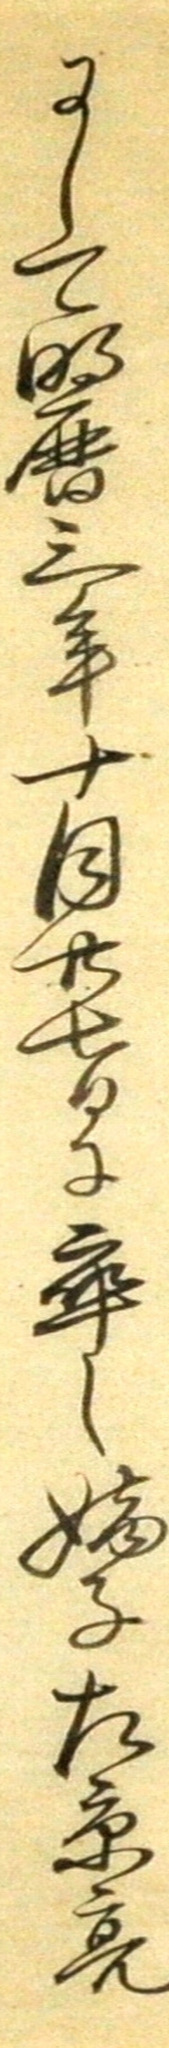にして明暦三年十月廿七日に卒し嫡子左京亮
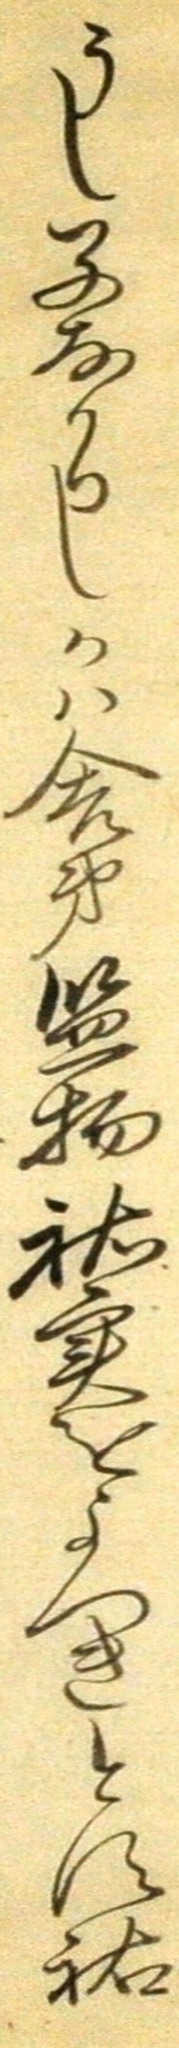うし子なかりしかは舎弟監物祐実をよつきとす祐
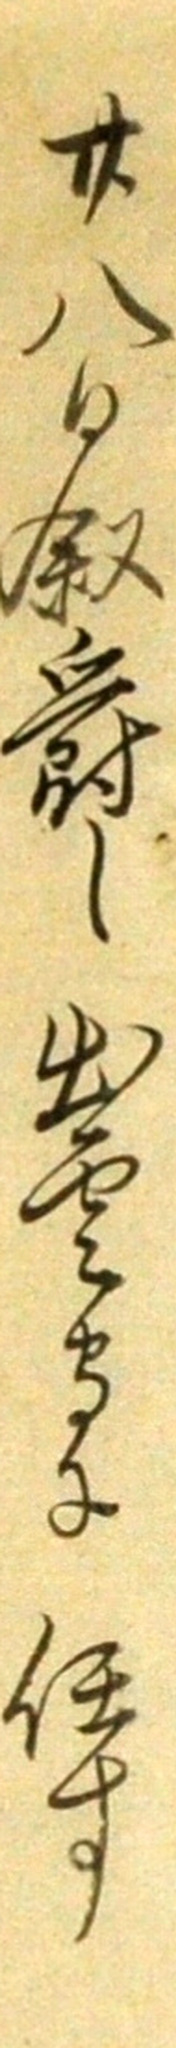廿八日叙爵し出雲守に任す

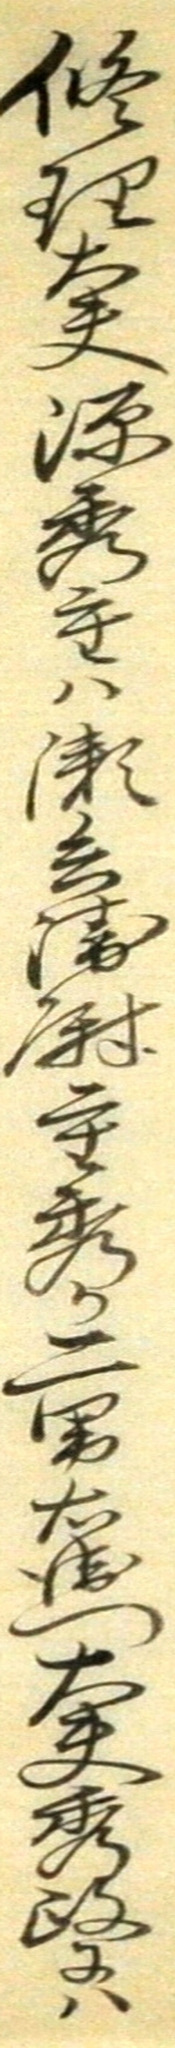修理大夫源秀重は瀬兵衛尉重秀か二男右衛門大夫秀政には
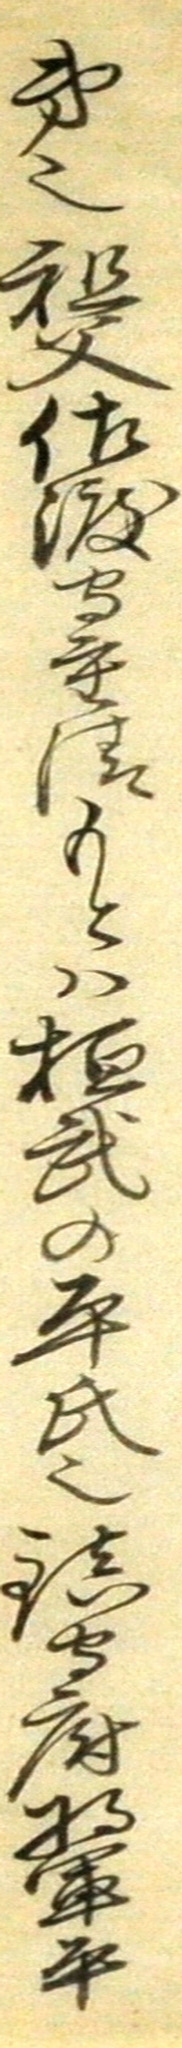弟也祖父佐渡守重清もとは桓武の平氏也鎮守府将軍平
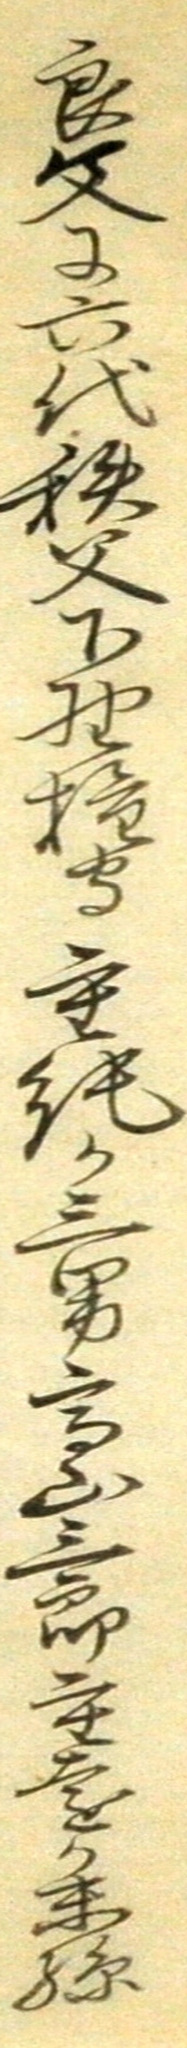良文に六代秩父下野権守重純か三男高山三郎重遠か末孫
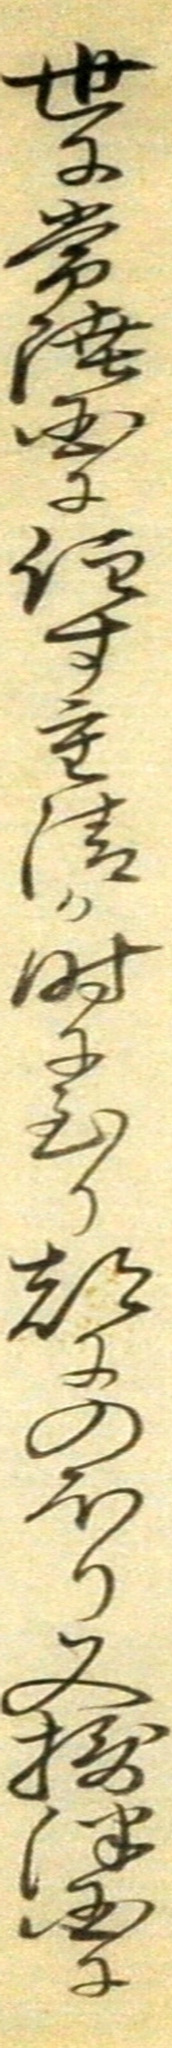世に常陸国に住す重清か時に至り都にのほり又摂津国に
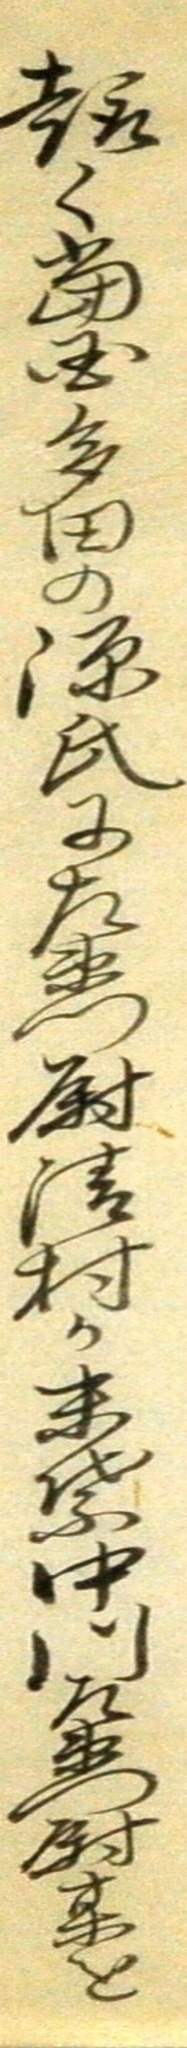趣く当国多田の源氏に左衛門尉清村か末葉中川左衛門尉某を
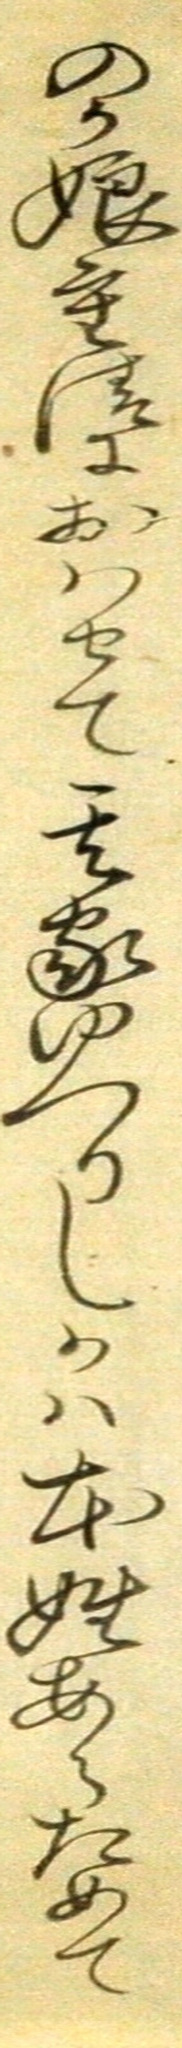のか娘重清におはせて其家ゆつりしかは本姓あらためて
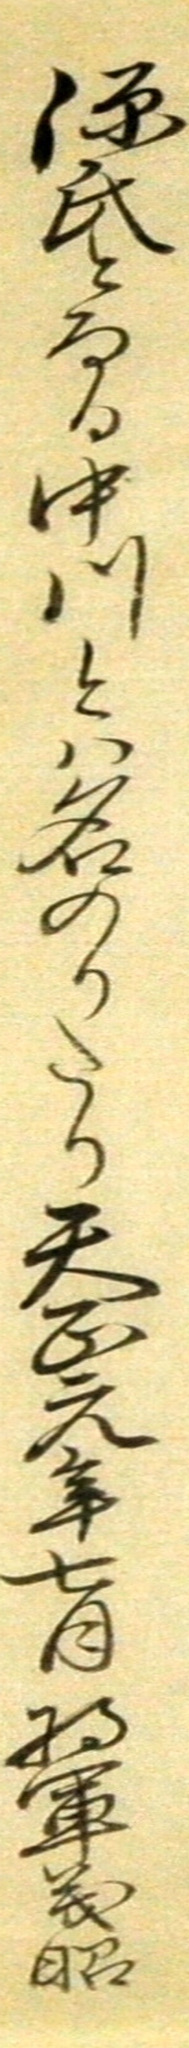源氏となる中川とは名のりたり天正元年七月将軍義昭
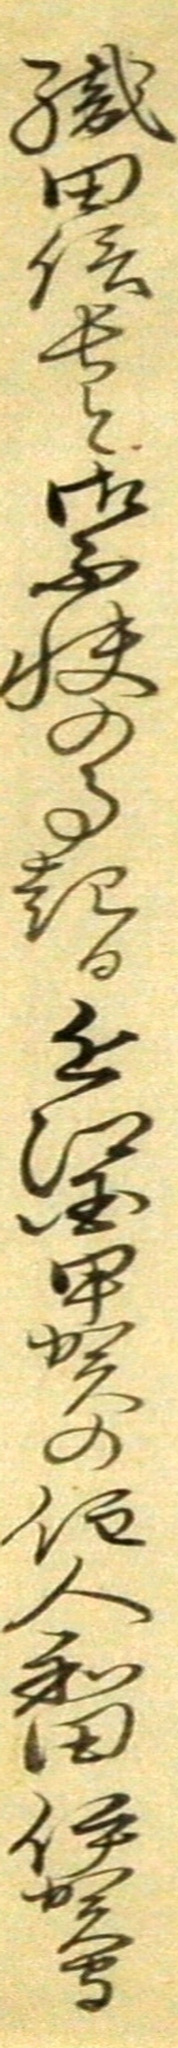織田信長と御不快の事起る近江国甲賀の住人和田伊賀守
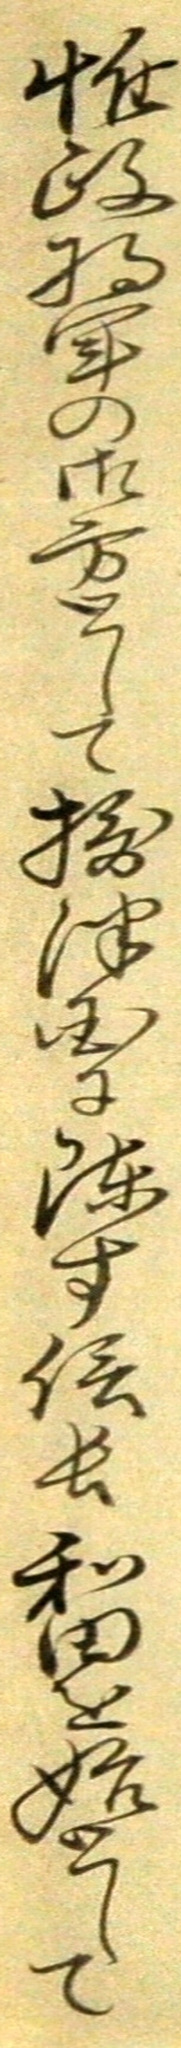惟政将軍の御方として摂津国に陣す信長和田を始として

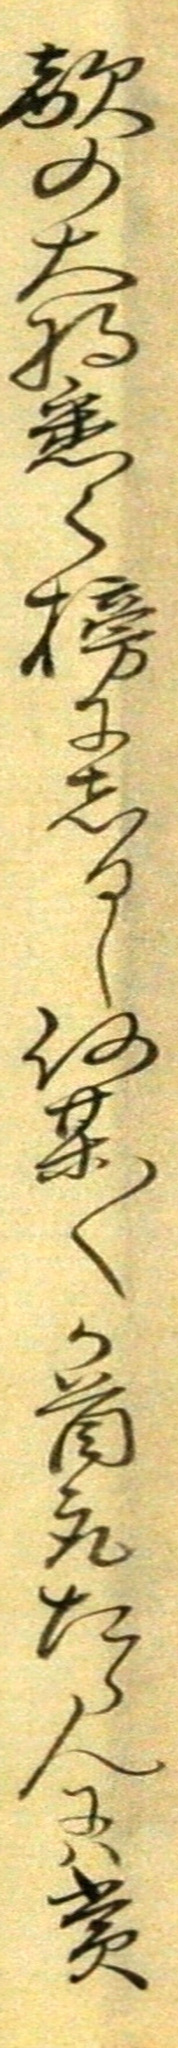敵の大将悉く榜にしるし何某〳〵か首取たらんには賞
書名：藩翰譜（九・下）
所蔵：伊那市立高遠町図書館・合同会社AMANE
